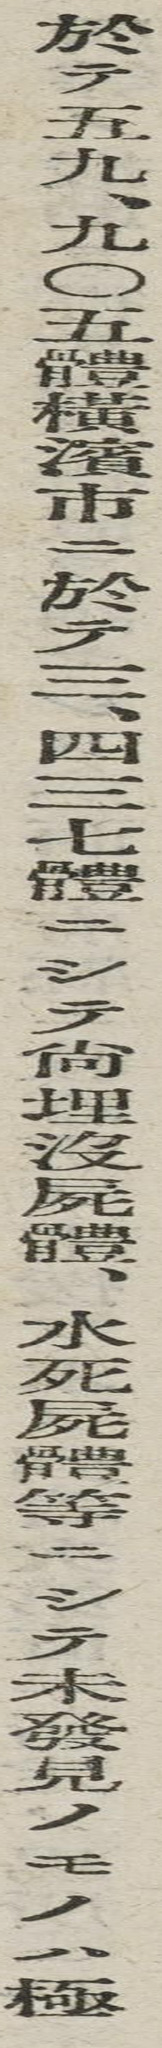於テ五九、九〇五体横浜市ニ於テ三、四三七体ニシテ尚埋没屍体、水死屍体等ニシテ未発見ノモノハ極
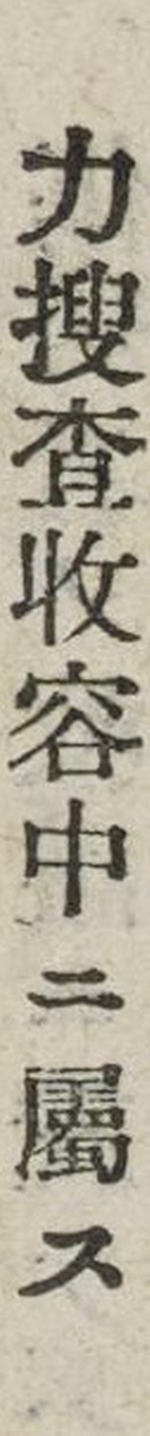力捜査収容中ニ属ス

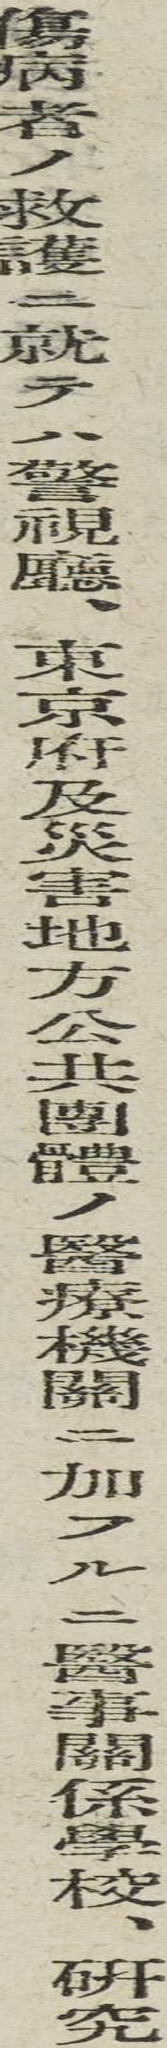傷病者ノ救護ニ就テハ警視庁、東京府及災害地方公共団体ノ医療機関ニ加フルニ医事関係学校、研究
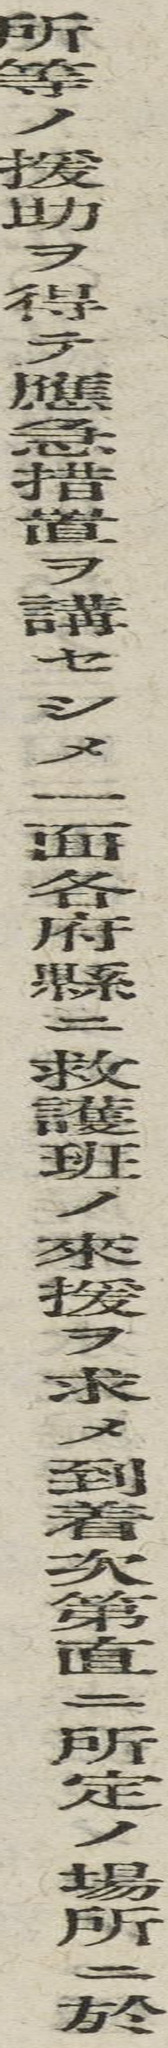所等ノ援助ヲ得テ応急措置ヲ講セシメ一面各府県ニ救護班ノ来援ヲ求メ到着次第直ニ所定ノ場所ニ於
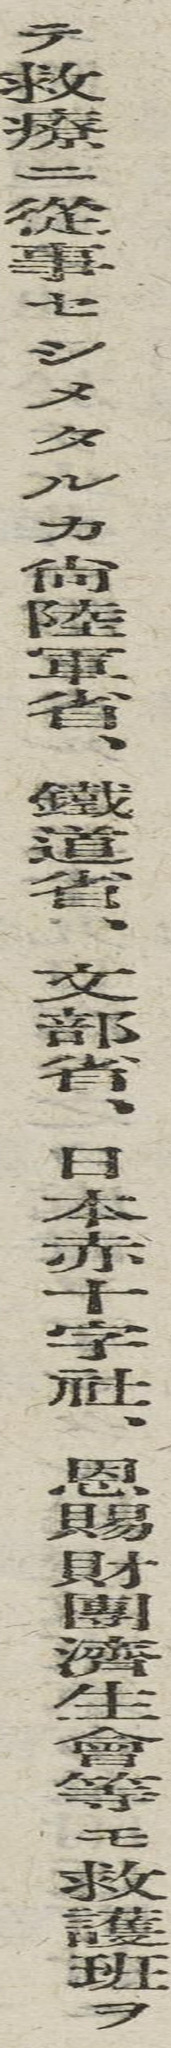テ救療ニ従事セシメタルカ尚陸軍省、鉄道省、文部省、日本赤十字社、恩賜財団済生会等モ救護班ヲ
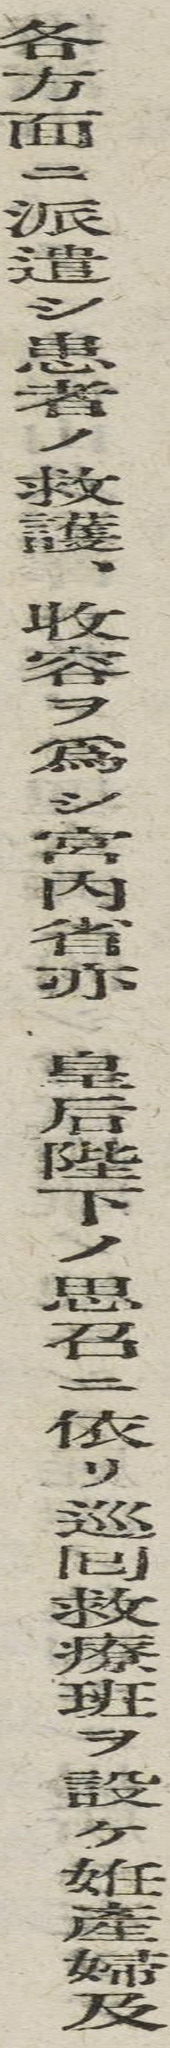各方面ニ派遣シ患者ノ救護、収容ヲ為シ宮内省亦皇后陛下ノ思召ニ依リ巡回救療班ヲ設ケ妊産婦及
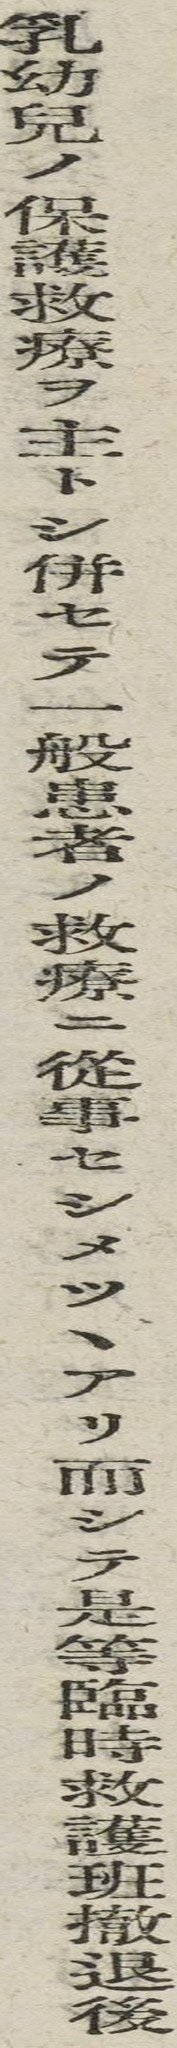乳幼児ノ保護救療ヲ主トシ併セテ一般患者ノ救療ニ従事セシメツヽアリ而シテ是等臨時救護班撤退後
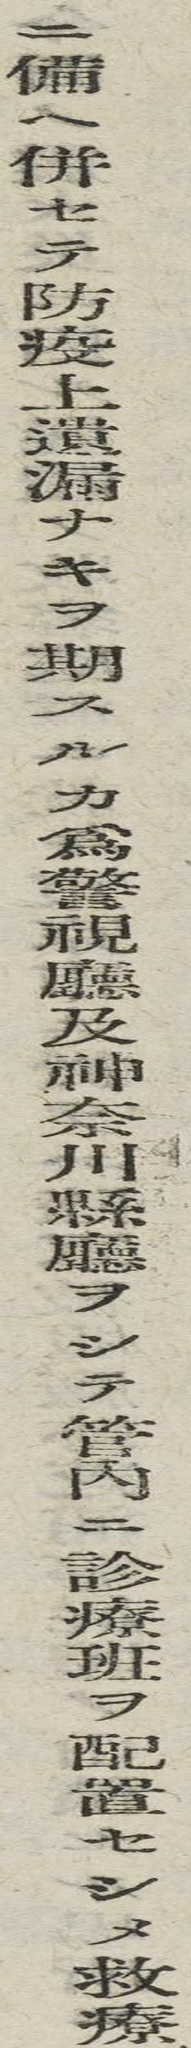ニ備ヘ併セテ防疫上遺漏ナキヲ期スルカ為警視庁及神奈川県庁ヲシテ管内ニ診療班ヲ配置セシメ救療
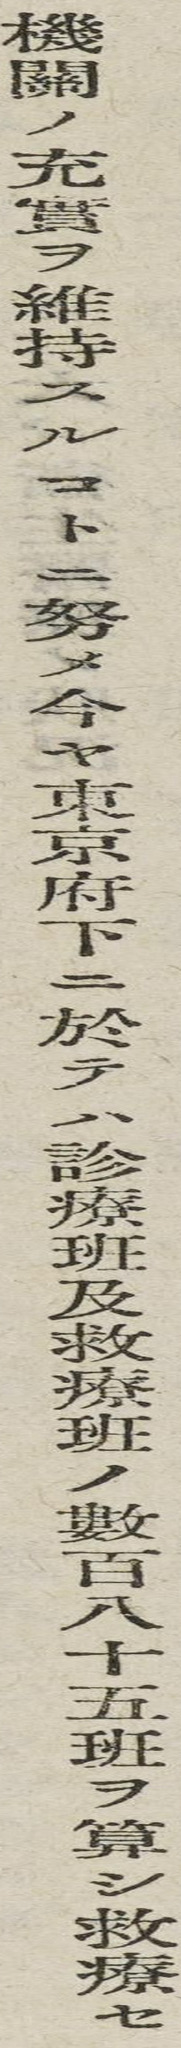機関ノ充実ヲ維持スルコトニ努メ今ヤ東京府下ニ於テハ診療班及救護班ノ数百八十五班ヲ算シ救療セ
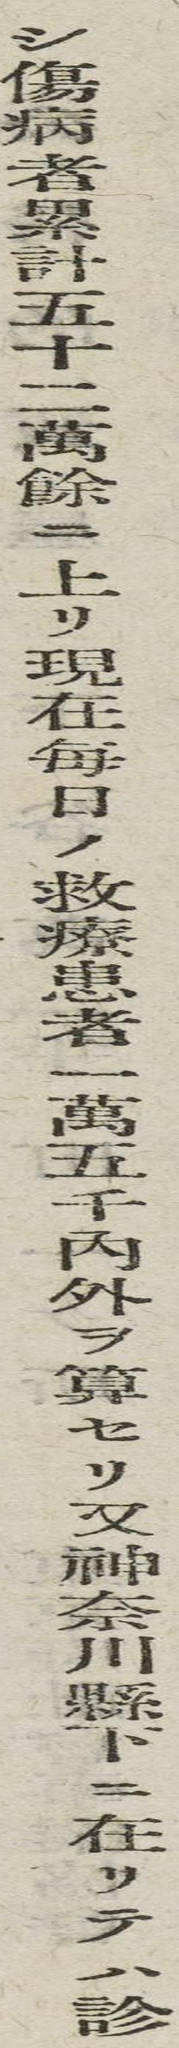シ傷病者累計五十二万余ニ上リ現在毎日ノ救療患者一万五千内外ヲ算セリ又神奈川県下ニ在リテハ診
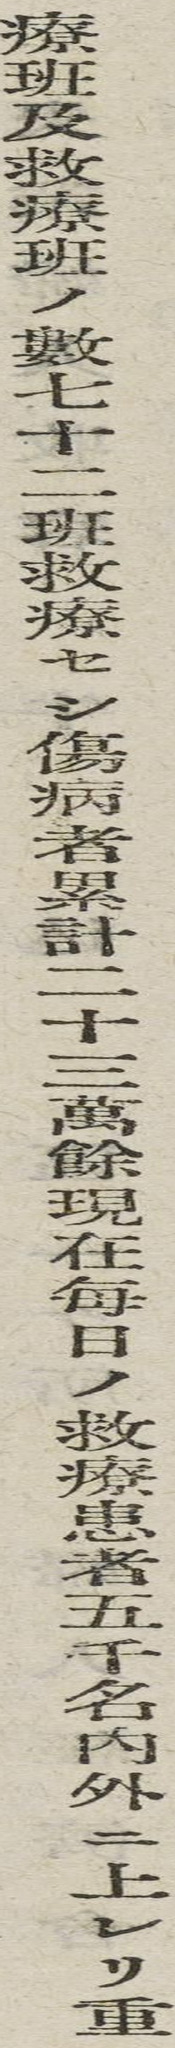療班及救療班ノ数七十二班救療セシ傷病者累計二十三万余現在毎日ノ救療患者五千名内外ニ上レリ重
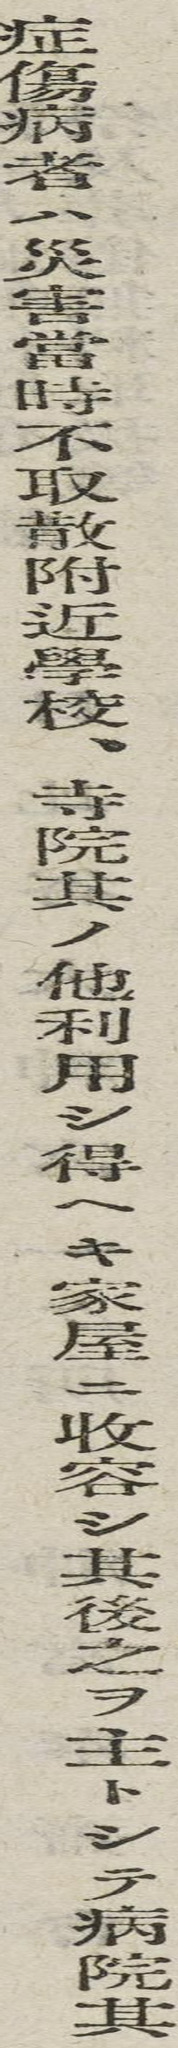症傷病者ハ災害当時不取散附近学校、寺院其ノ他利用シ得ヘキ家屋ニ収容シ其後之ヲ主トシテ病院其
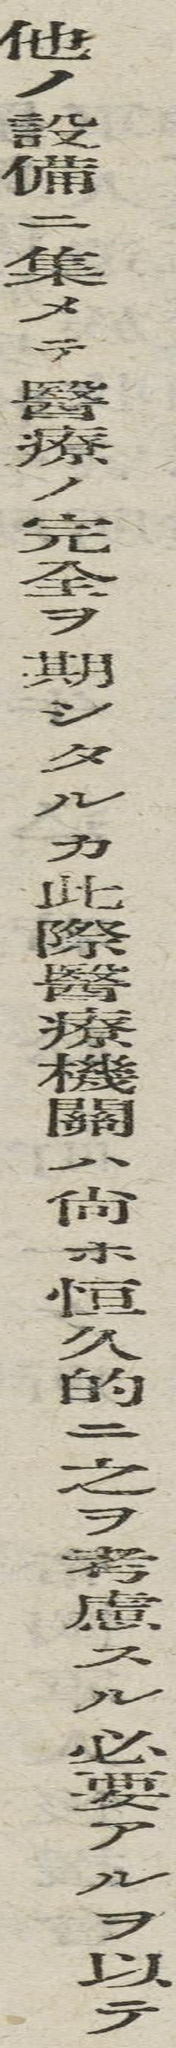他ノ設備ニ集メテ医療ノ完全ヲ期シタルカ此際医療機関ハ尚ホ恒久的ニ之ヲ考慮スル必要アルヲ以テ
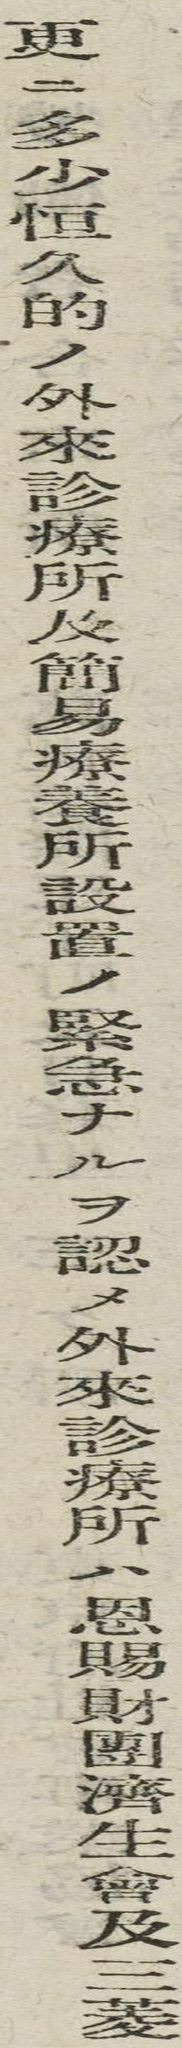更ニ多少恒久的ノ外来診療所及簡易療養所設置ノ緊急ナルヲ認メ外来診療所ハ恩賜財団済生会及三菱
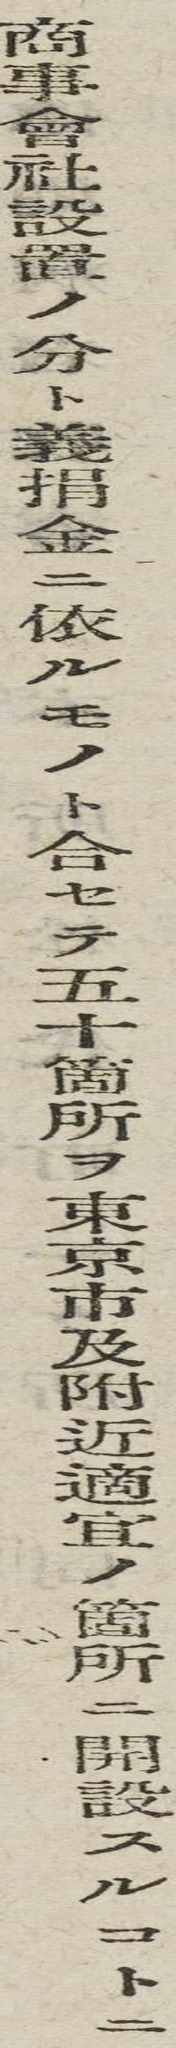商事会社設置ノ分ト義捐金ニ依ルモノト合セテ五十箇所ヲ東京市及附近適宜ノ場所ニ開設スルコトニ
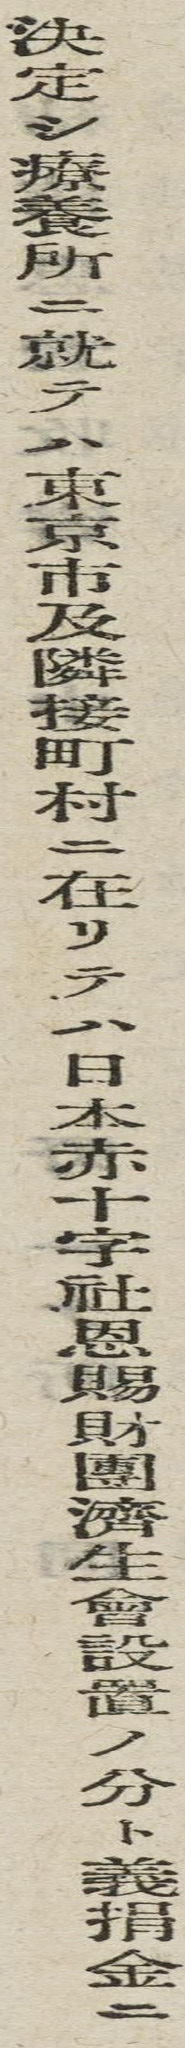決定シ療養所ニ就テハ東京市及隣接町村ニ在リテハ日本赤十字社恩賜財団済生会設置ノ分ト義捐金ニ
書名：震災被害状況並救護施設概要
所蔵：東京大学地震研究所図書室 Earthquake Research Institute Library, The University of Tokyo, JAPAN
